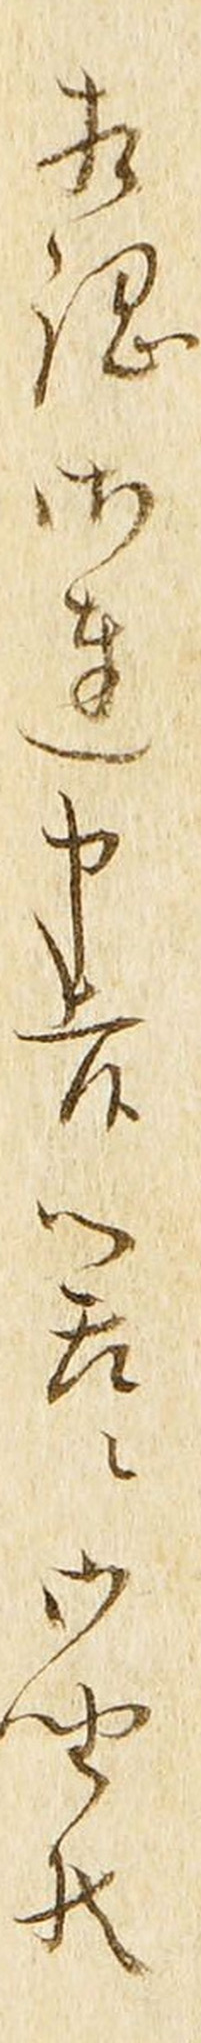相認御連申上候筈に御座候
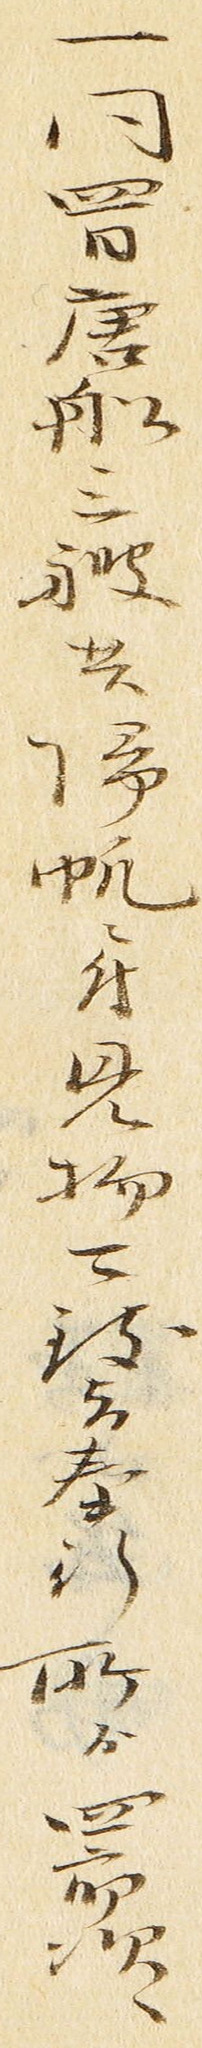一同四日唐船三艘共帰帆に付見物可致旨奉行所ゟ四郎次へ
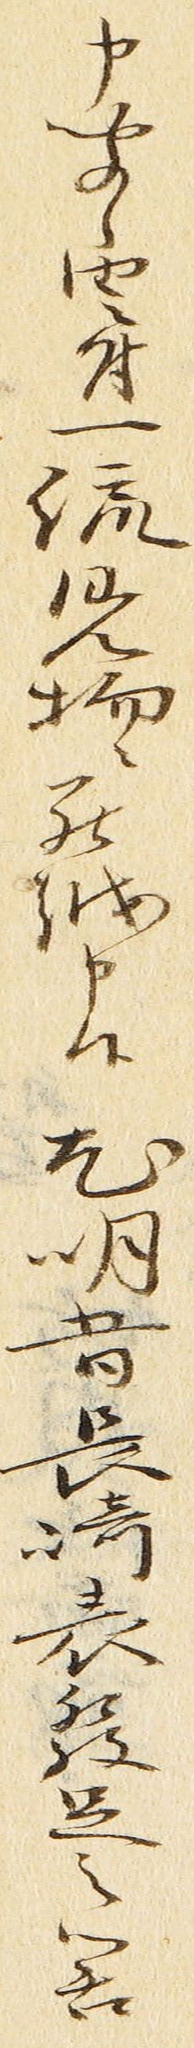申聞候由に付一統見物に罷越申候尤明五日長崎発足之筈
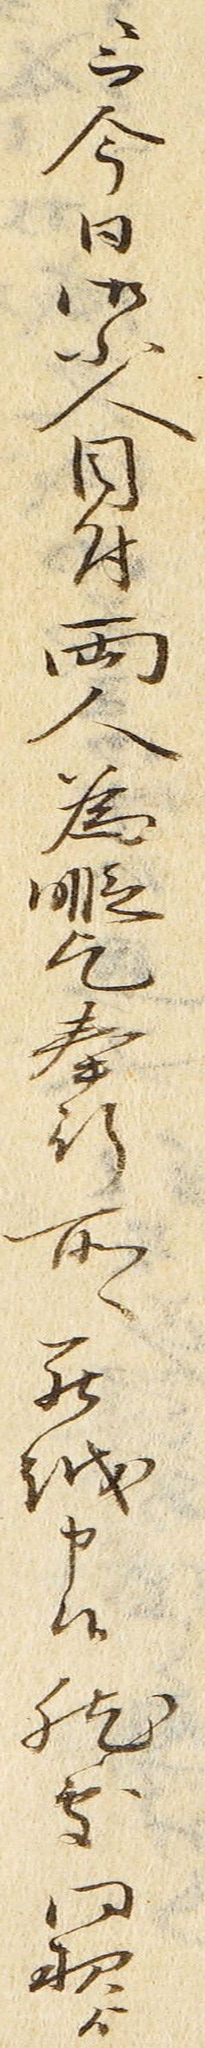に而今日御小人目付両人為暇乞奉行所へ罷越申候然處同夜ゟ
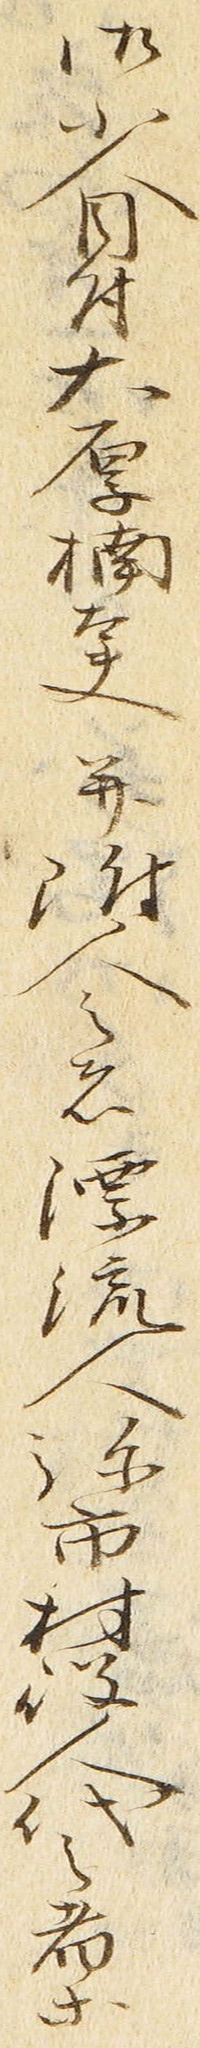御小人目付大原楠大夫並附人之者漂流人弥市村役人代之者等
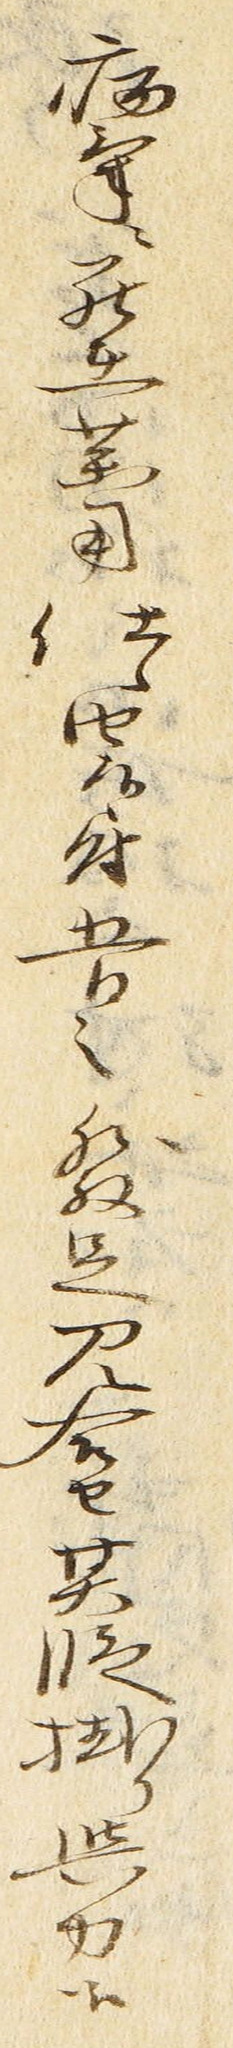病気に罷在薬用仕候由候に付五日之発足見合せ其段掛り与力江
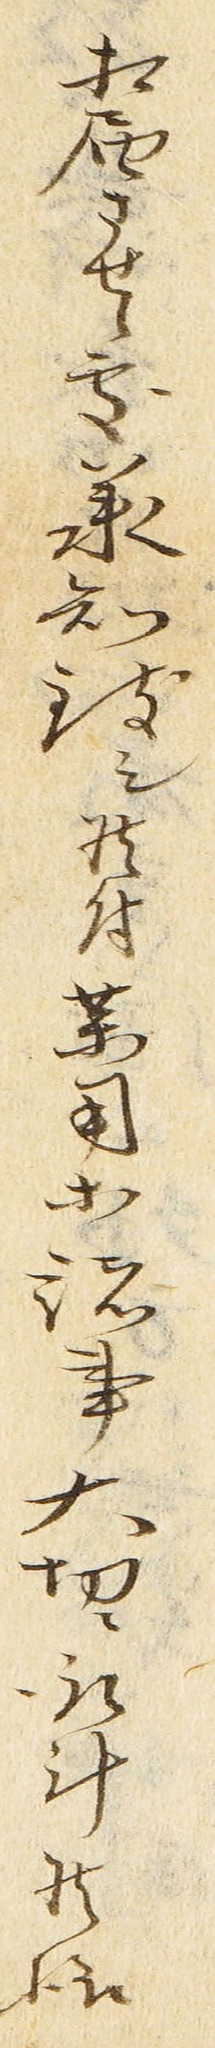相届させ候處承知致し候付薬用等諸事大切に取計候様
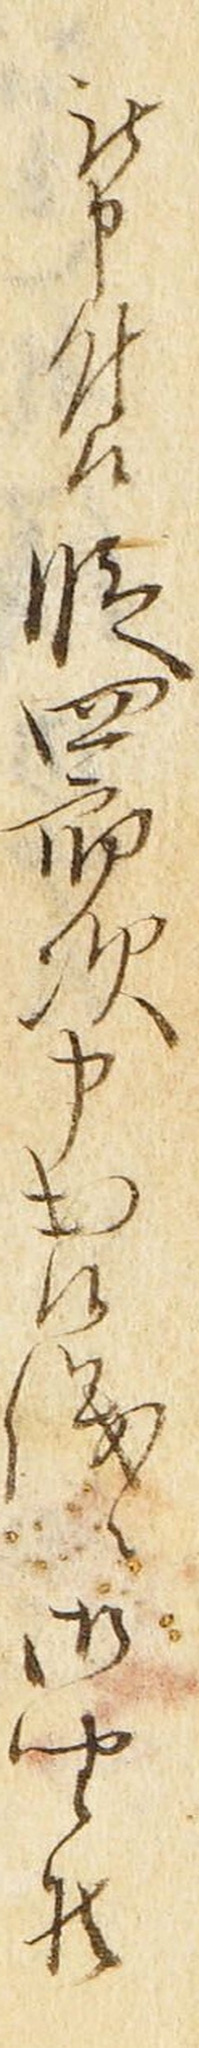被申付候段四郎次申出候儀に御座候
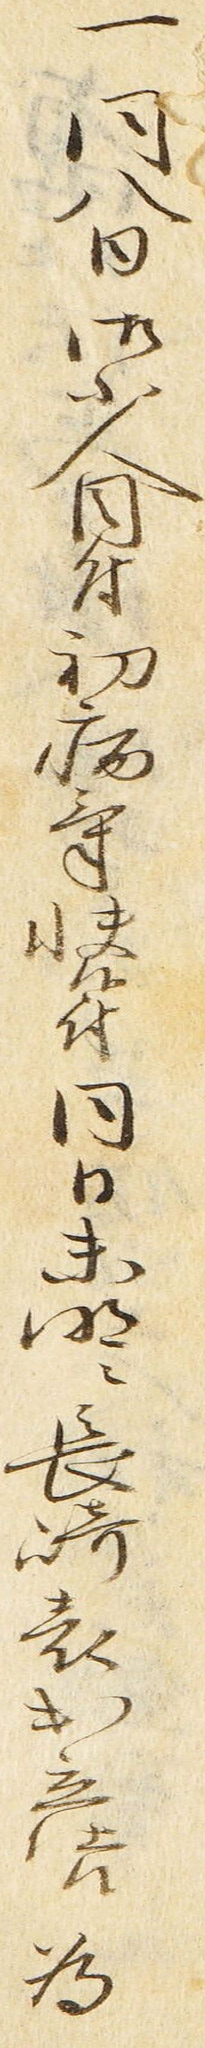一同八日御小人目付初病気快候付同日未明に長崎表出立仕候為
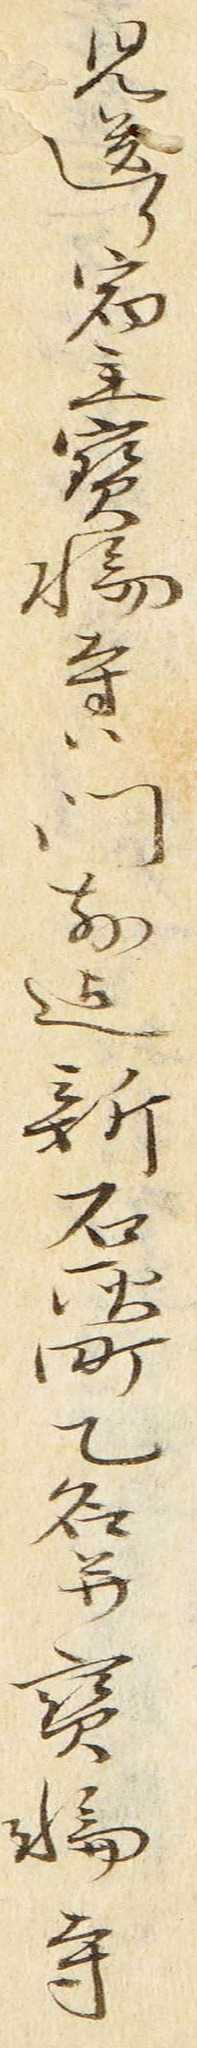見送り宿主宝輪寺は門前迄新石灰町乙名並宝輪寺
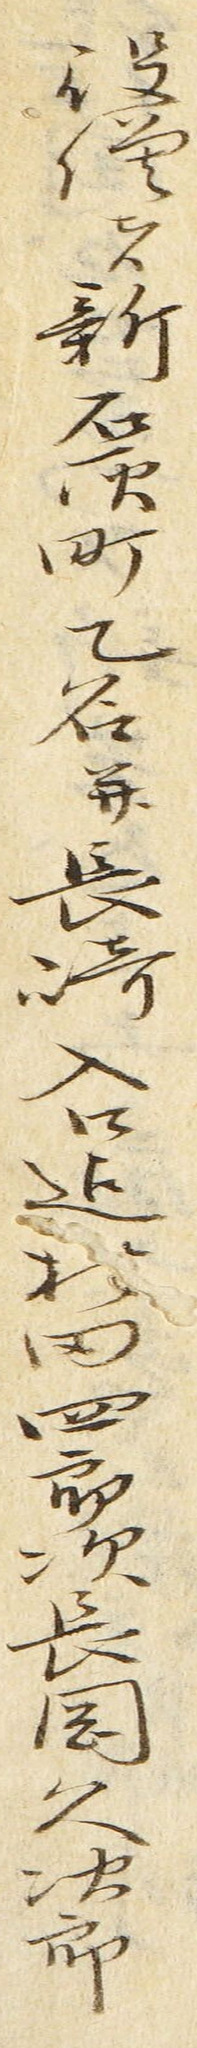役僧は新石灰町乙名並長崎入口迠村田四郎次長岡久次郎

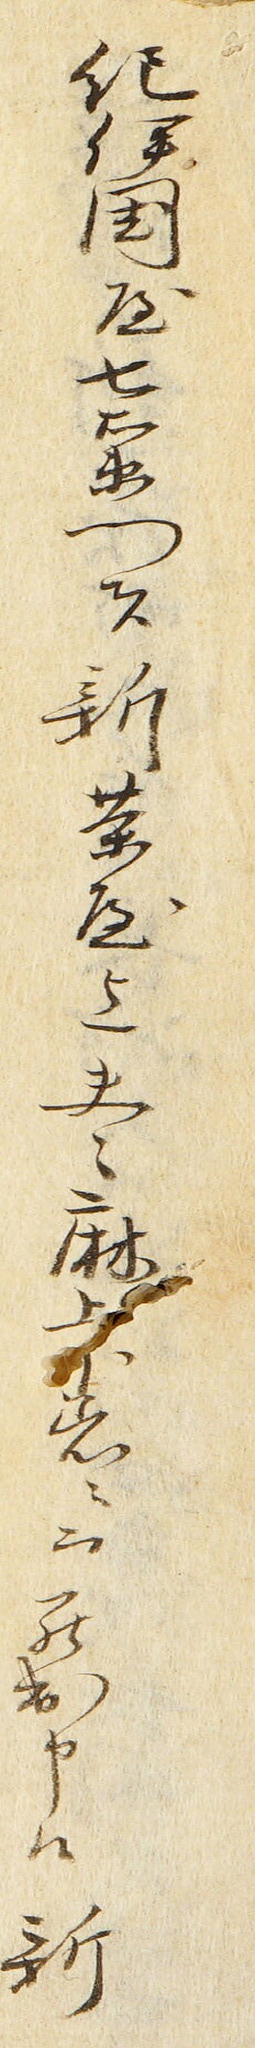紀伊国屋七右衛門は新茶屋迠夫々麻上下着に而罷出申候新
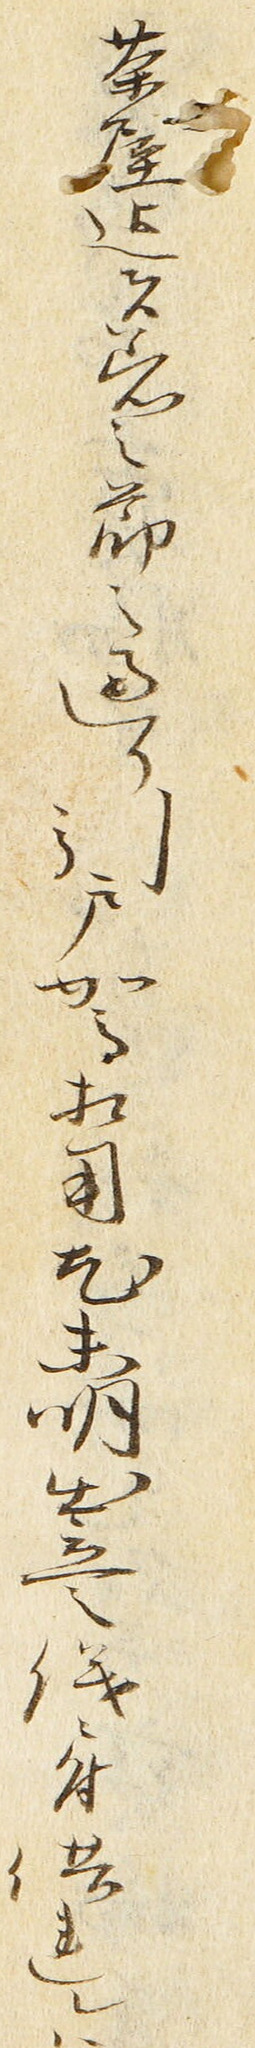茶屋迠は着之筋之通り引戸駕相用尤未明出立之儀に付供連れは
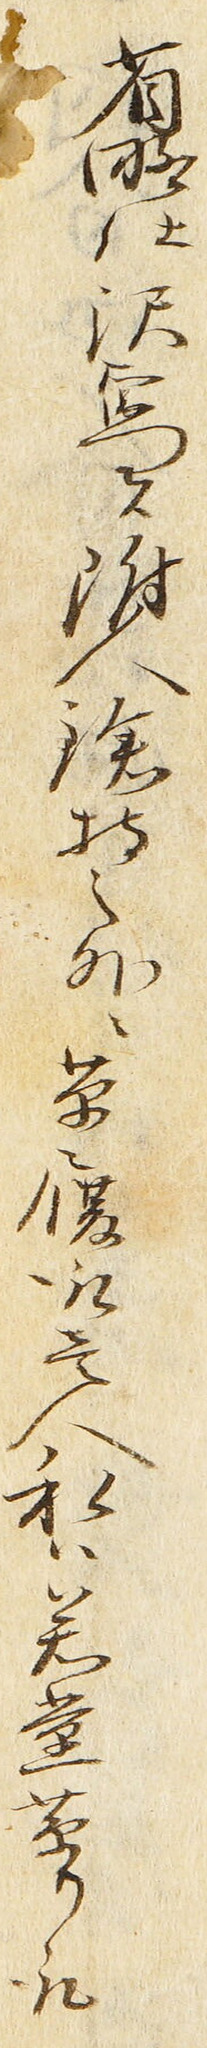省略仕沢右衛門は附人鎗持之外に草履取壱人私は若党草り取
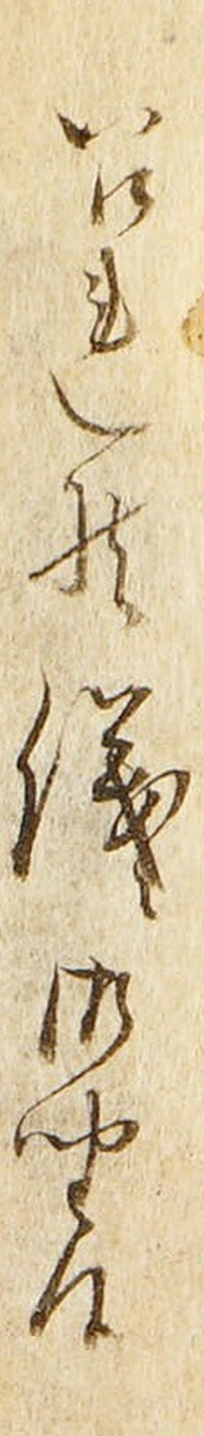召連候儀御座候
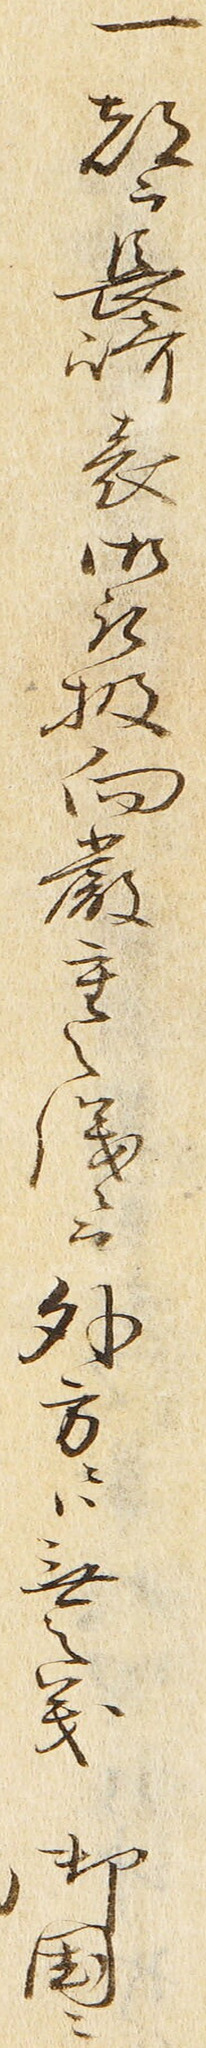一却而長崎表御取扱向厳重之儀に而外方には無之義御国
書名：長崎漂流記
